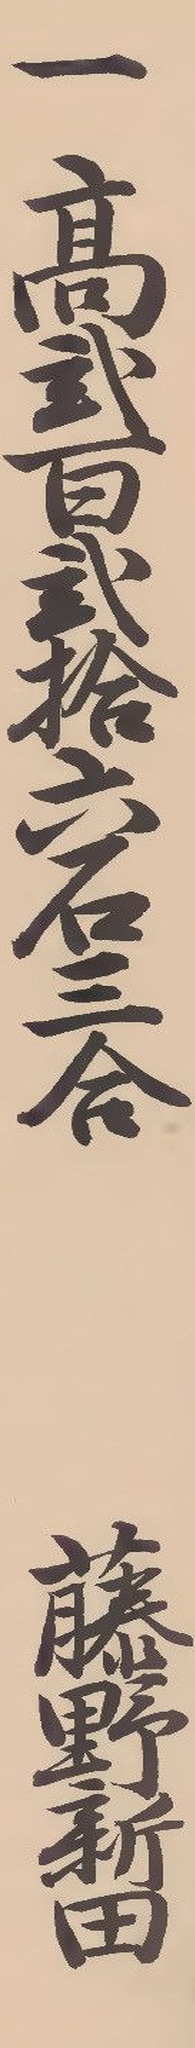一高弐百弐拾六石三合藤野新田
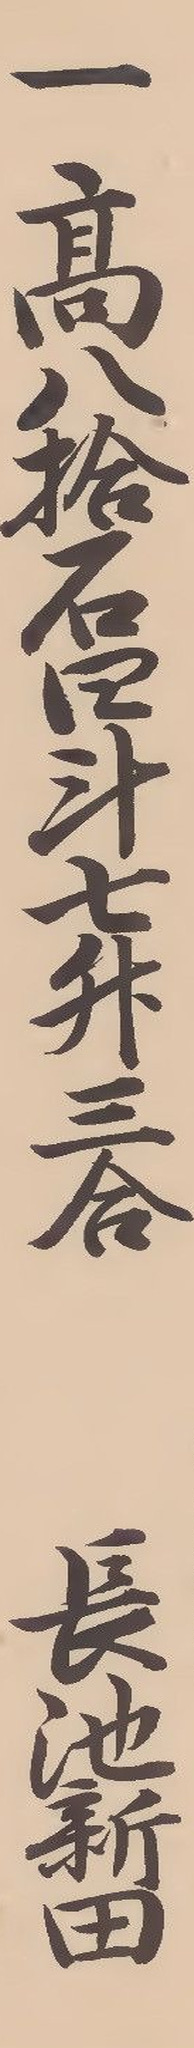一高八拾石四斗七升三合長池新田
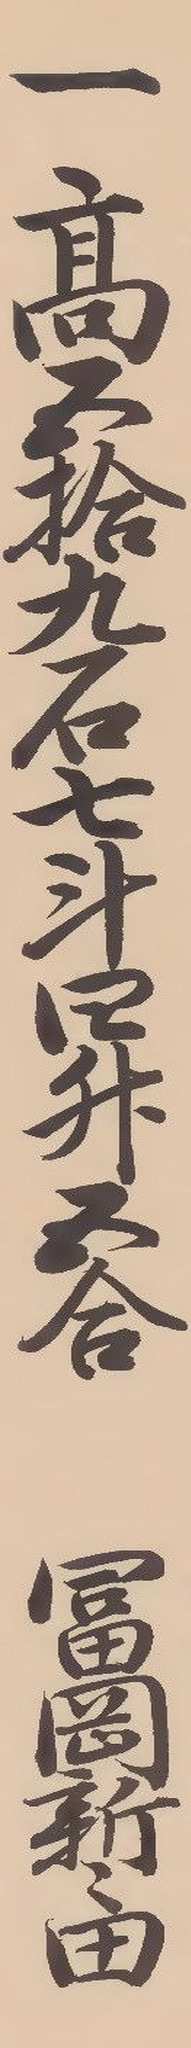一高五拾九石七斗四升五合富岡新々田
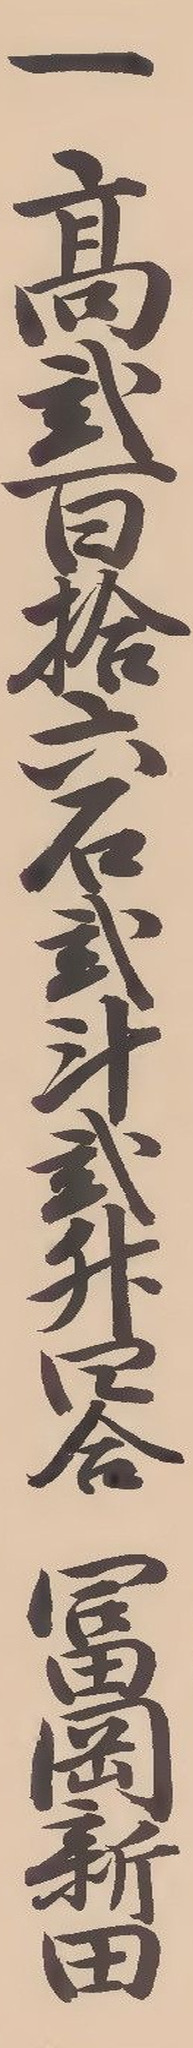一高二百拾六石弐斗弐升四合富岡新田

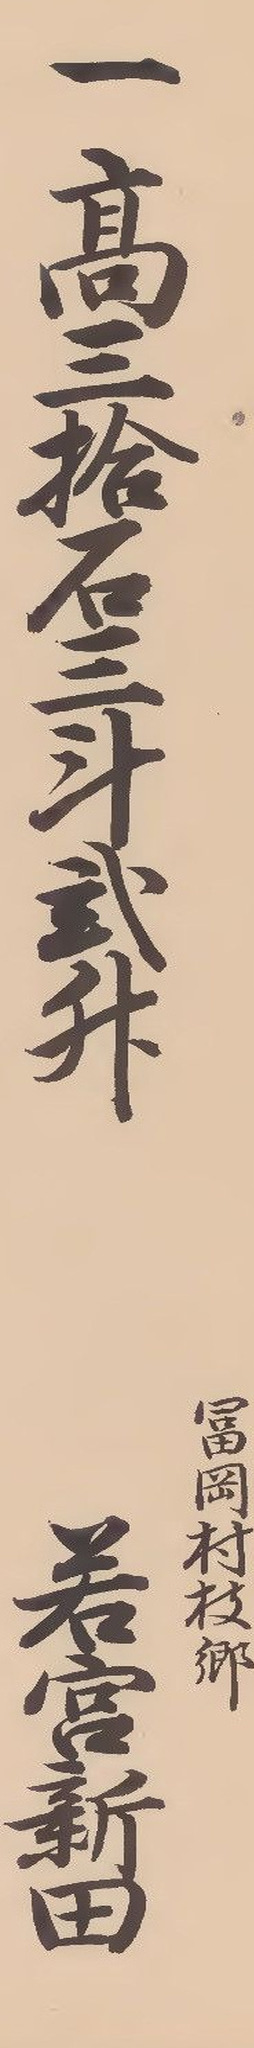一高三拾石三斗弐升若宮新田
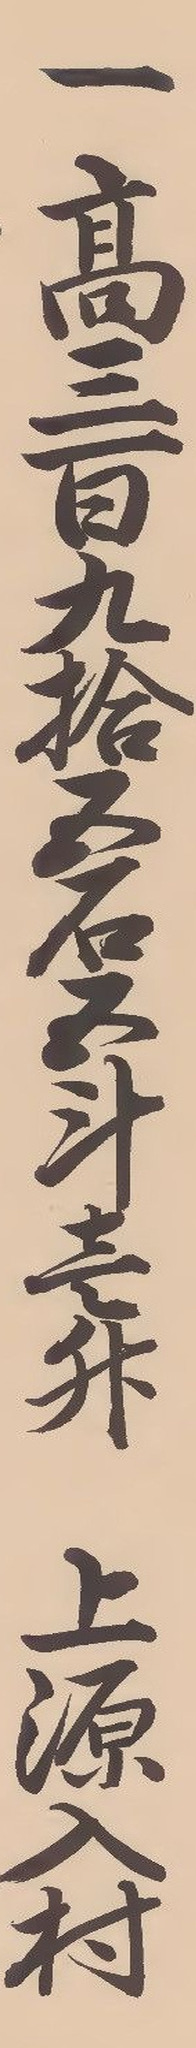一高三百九拾五石五斗壱升上源入村
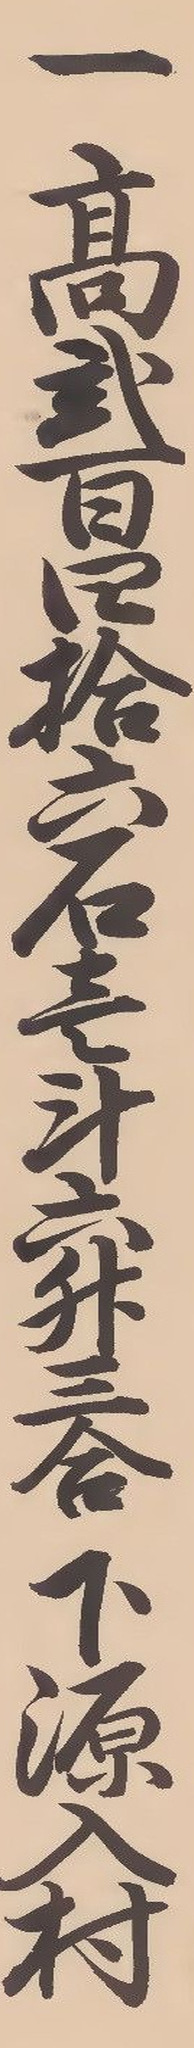一高弐百四拾六石壱斗六升三合下源入村
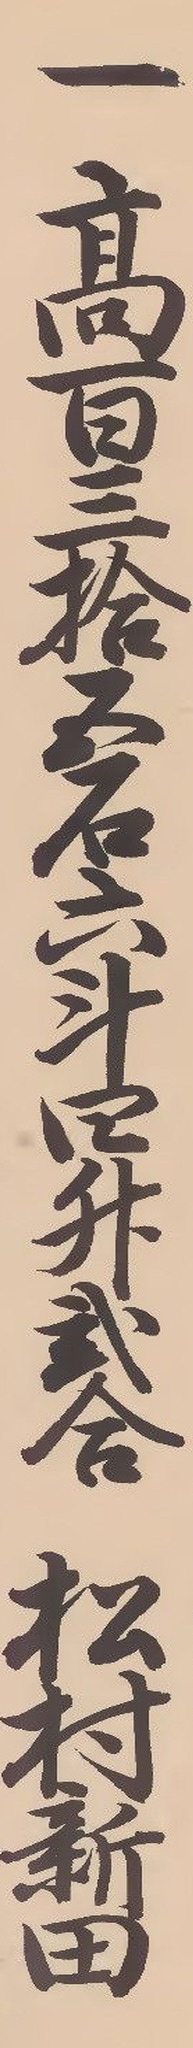一高百三拾五石六斗四升弐合松村新田
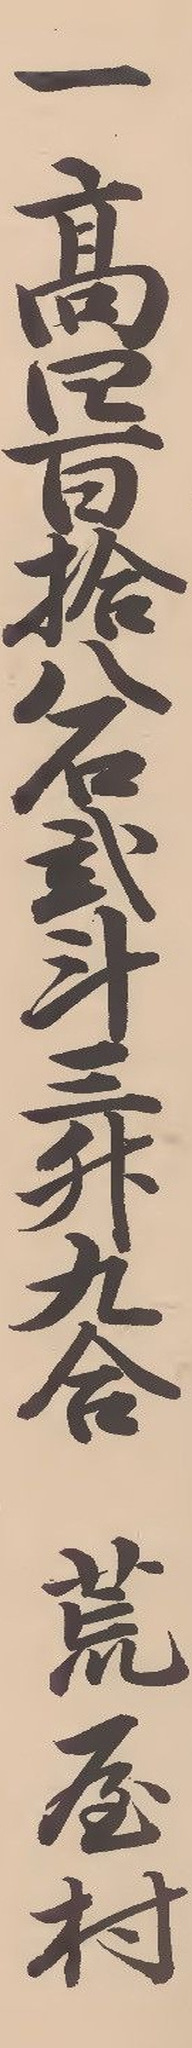一高四百拾八石弐斗三升九合荒屋村
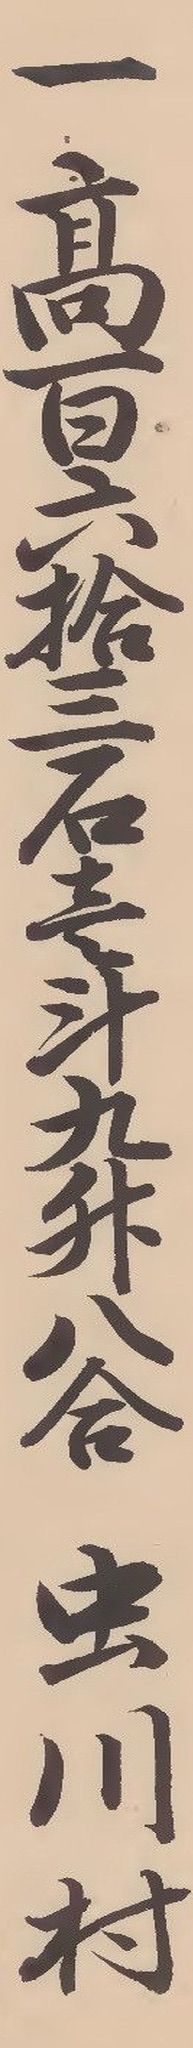一高百六拾三石壱斗九升八合虫川村
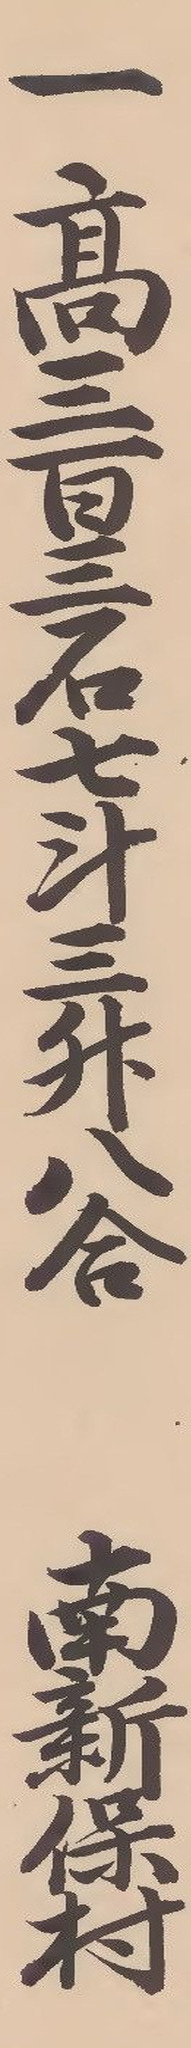一高三百三石七斗三升八合南新保村
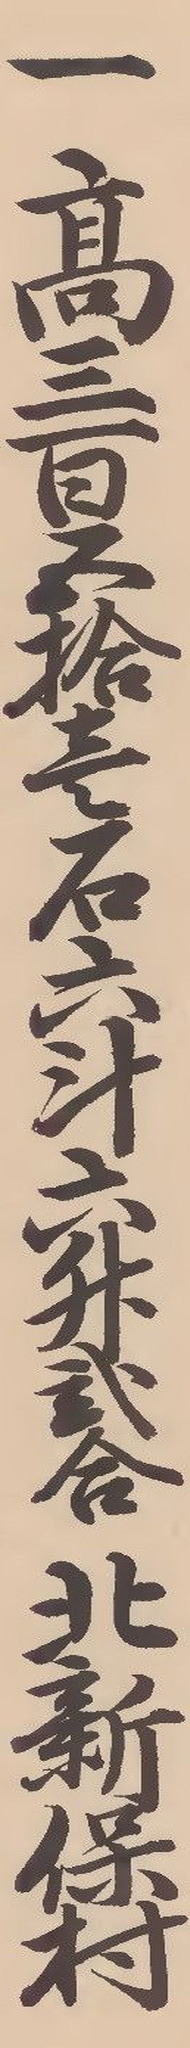一高三百五拾壱石六斗六升弐合北新保村

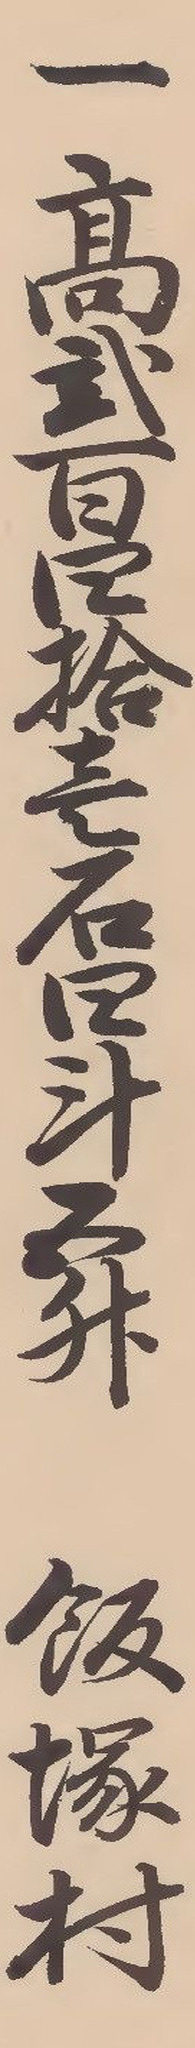一高弐百四拾壱石四斗五升飯塚村
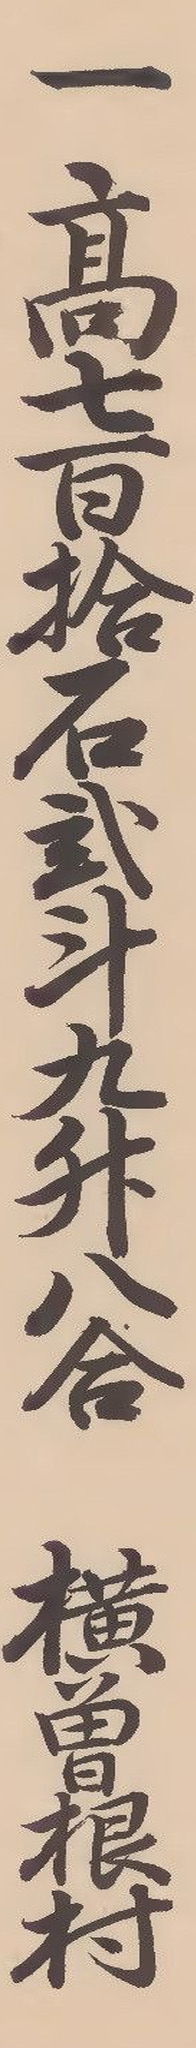一高七百拾石弐斗九升八合横曽根村
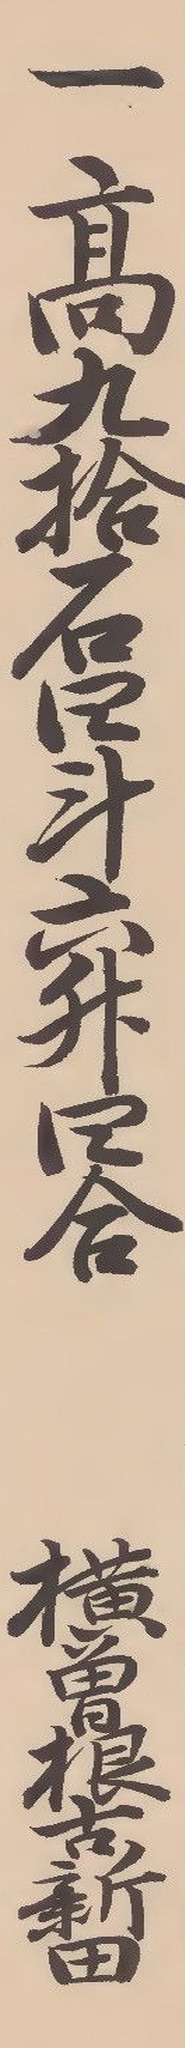一高九拾石四斗六升四合横曽根古新田
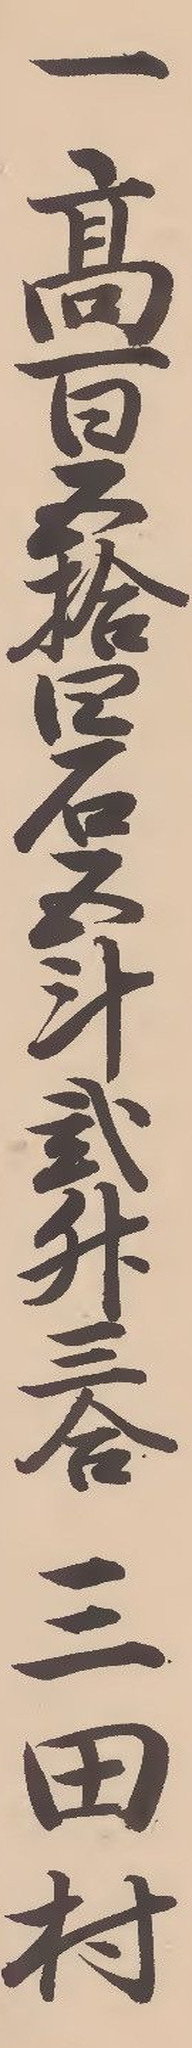一高百五拾四石五斗弐升三合三田村
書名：越後国郷帳　上
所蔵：国立公文書館 National Archives of Japan
